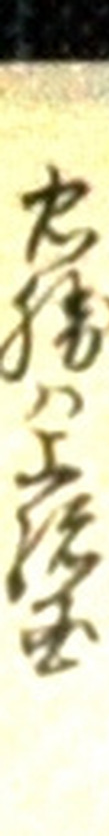忠勝は上総国
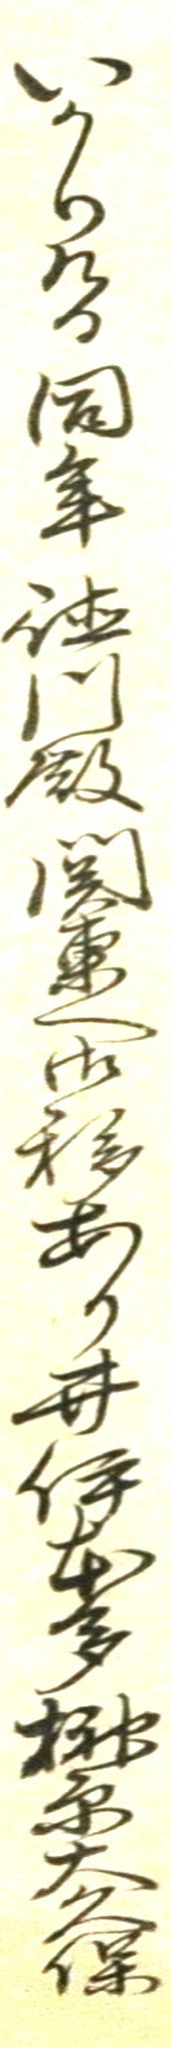いかりける同年徳川殿関東へ御移あり井伊本多榊原大久保
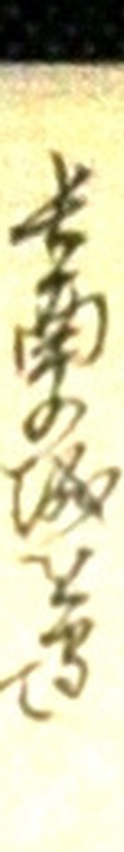長南の城を守て
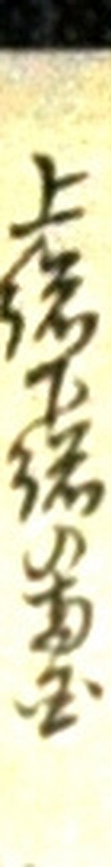上総下総の両国
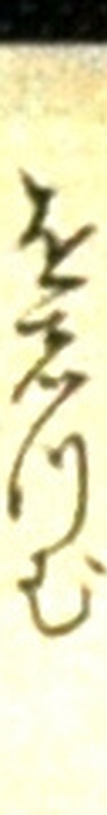をしつむ
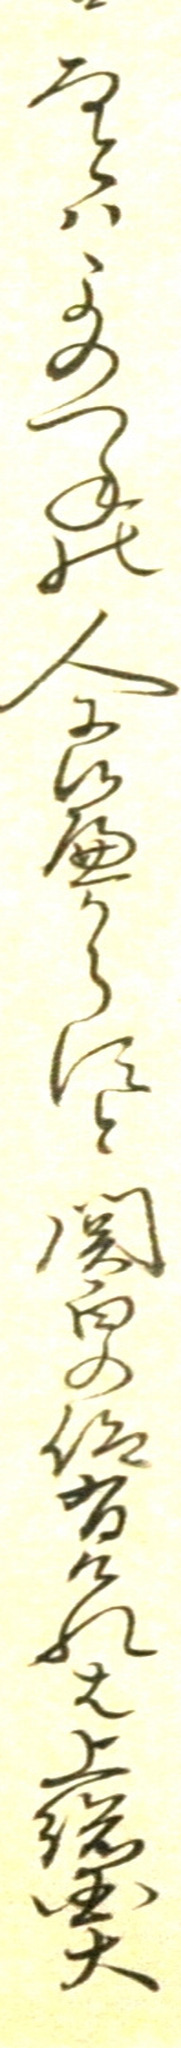なとはよのつねの人に候へからすと関白の仰有けれは上総国大
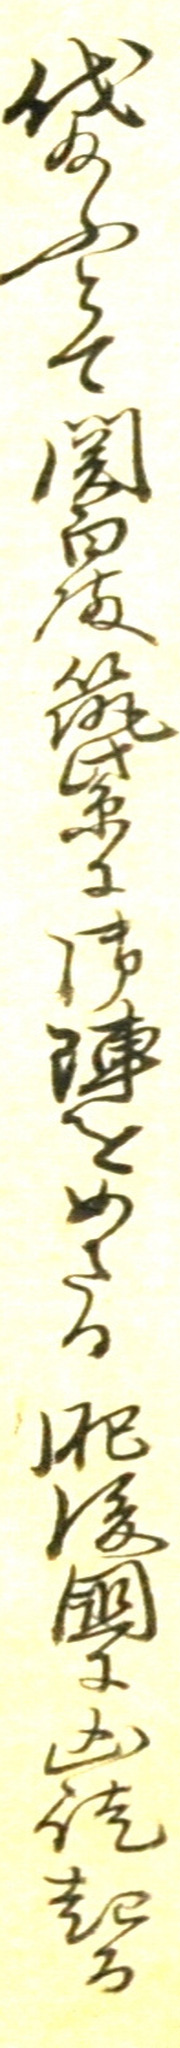伐給ふとて関白殿築紫に御陣をめさる肥後国に凶徒起る

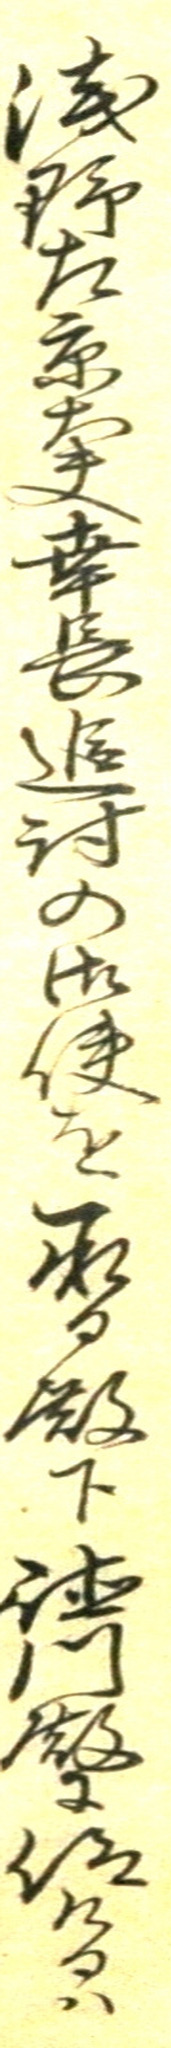浅野左京大夫幸長追討の御使を承る殿下徳川殿に仰けるは
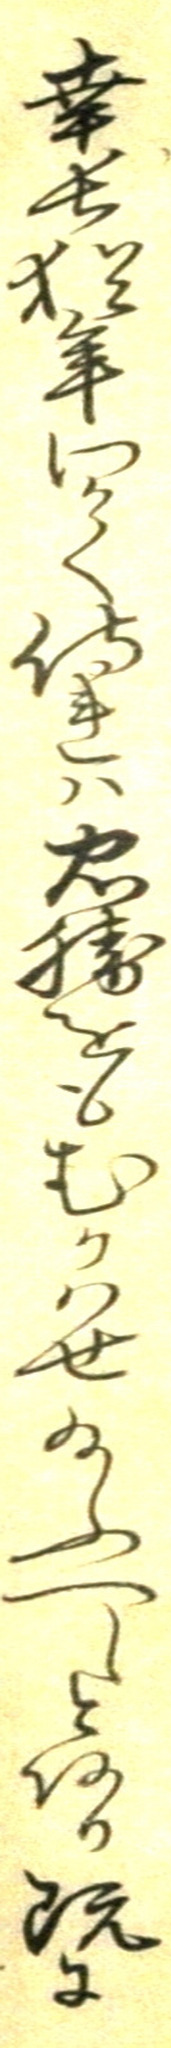幸長猶年わかく侍れは忠勝をもむかはせ給ふへしとあり既に
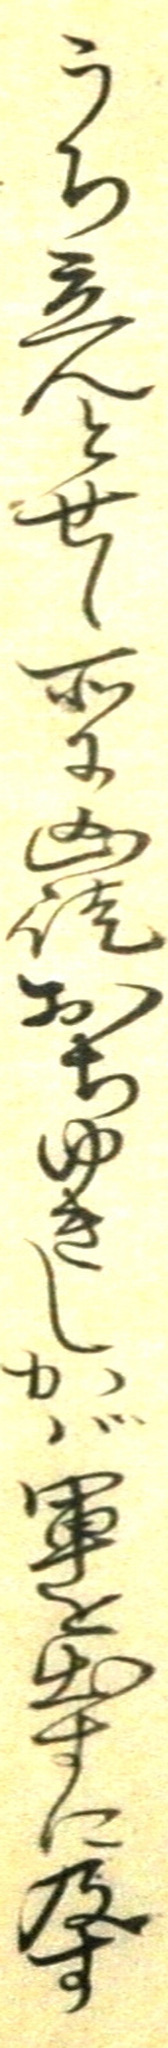うち立んとせし所に凶徒おちゆきしかば軍を出すに及す
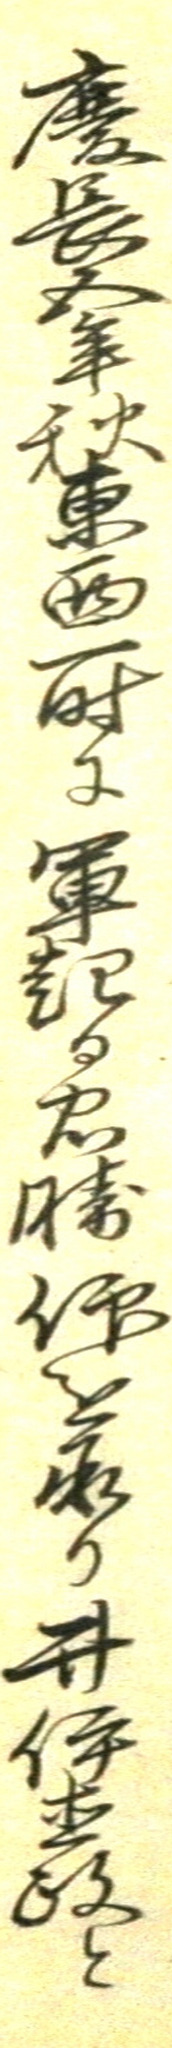慶長五年秋東西一時に軍起る忠勝仰を承り井伊直政と
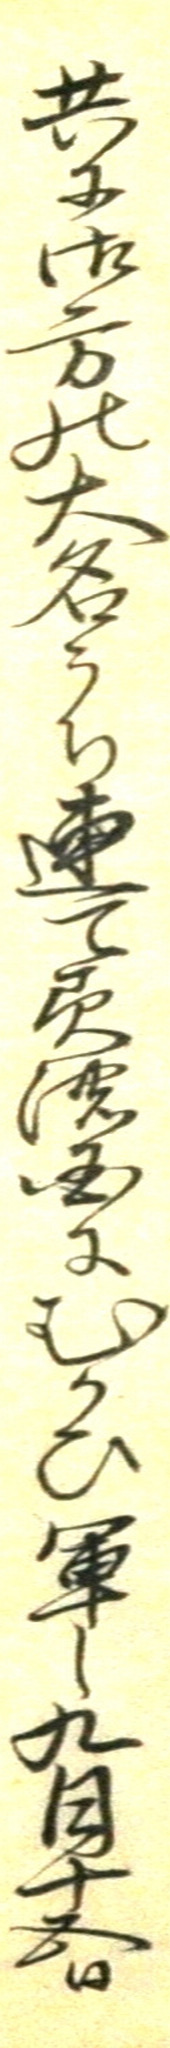共に御方の大名うち連て美濃国にむかひ軍し九月十五日
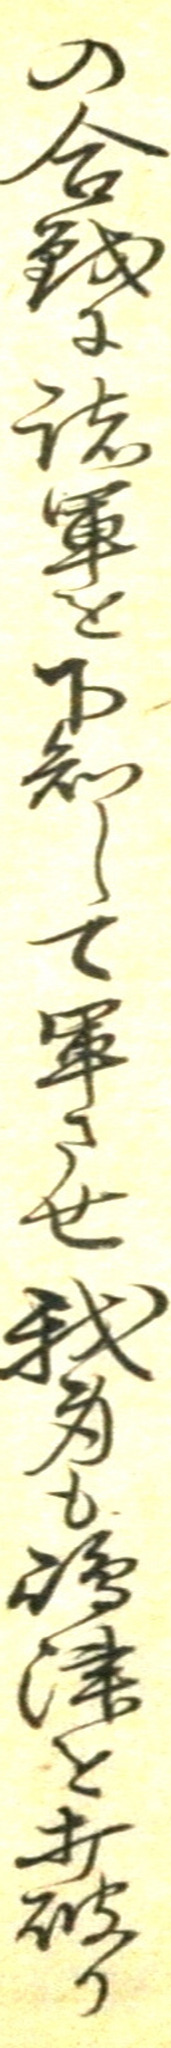の合戦に諸軍を下知して軍させ我身も島津を打破り
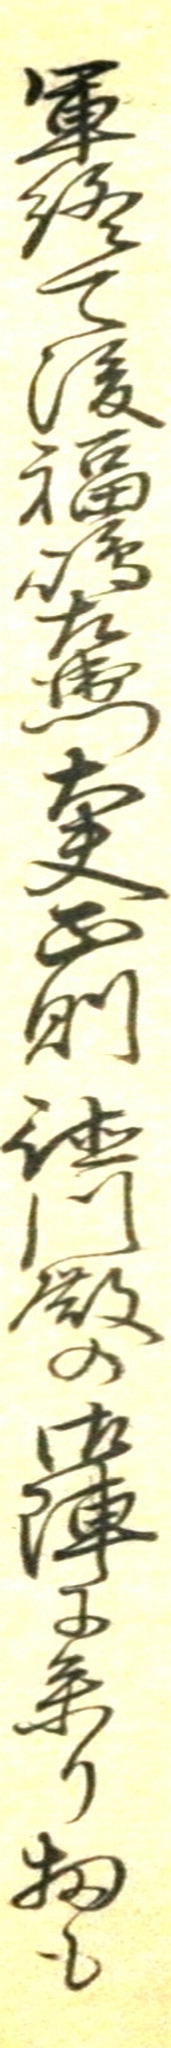軍終て後福島左衛門大夫正則徳川殿の御陣に参り扨も
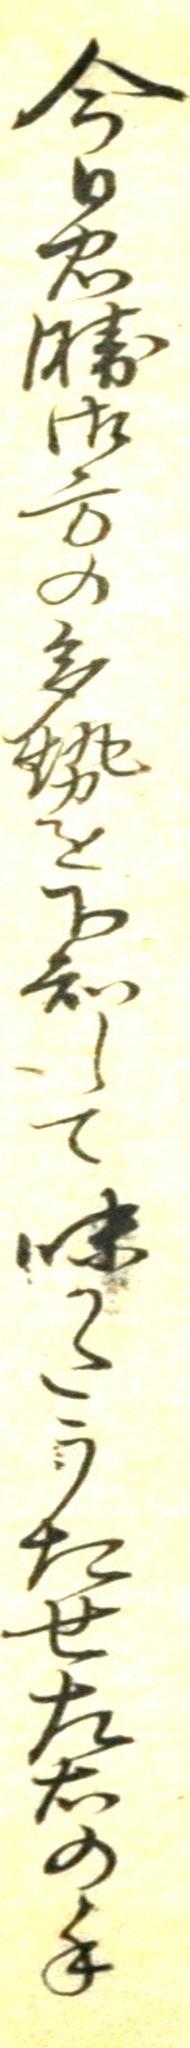今日忠勝御方の多勢を下知して味かたうたせ左右の手
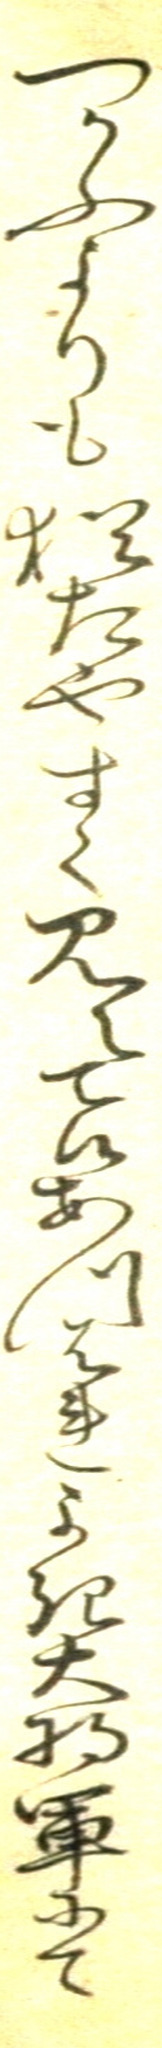つかふよりも猶たやすく見えて候あつはれよき大将軍にて
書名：藩翰譜（四・上）
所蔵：伊那市立高遠町図書館・合同会社AMANE
